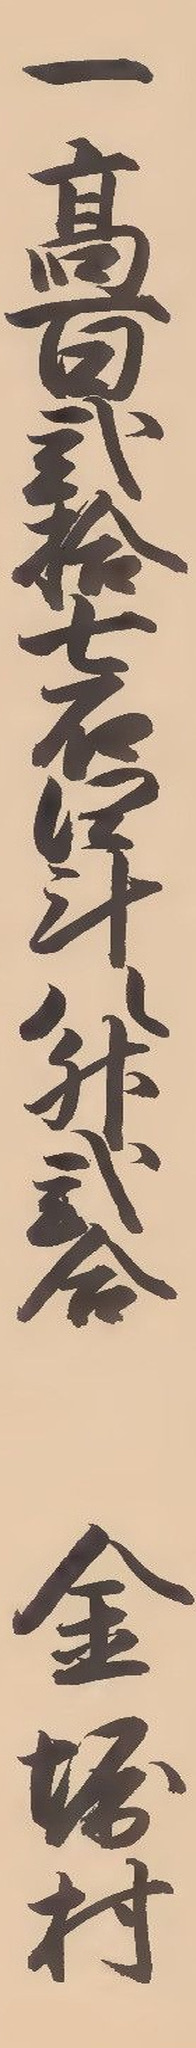一高百弐拾七石四斗八升弐合金堀村
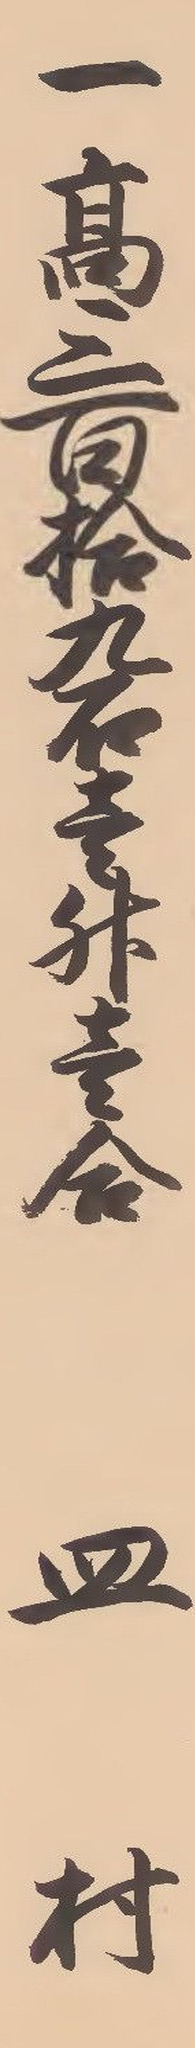一高三百拾九石壱升壱合皿村
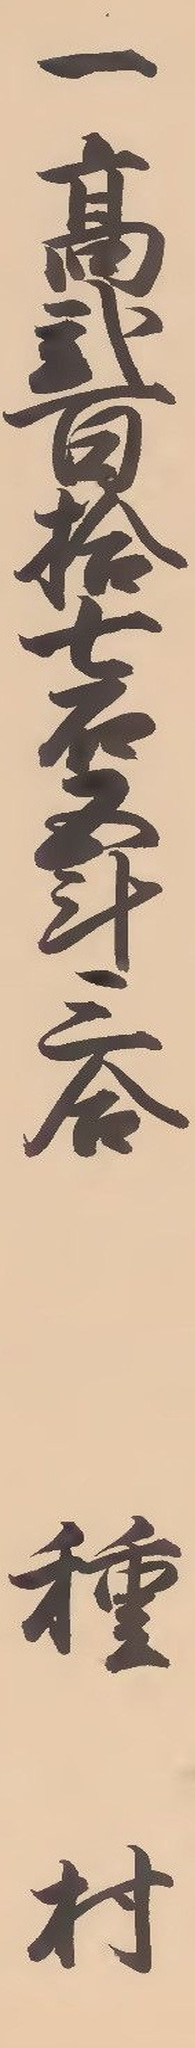一高弐百拾七石五斗三合種村
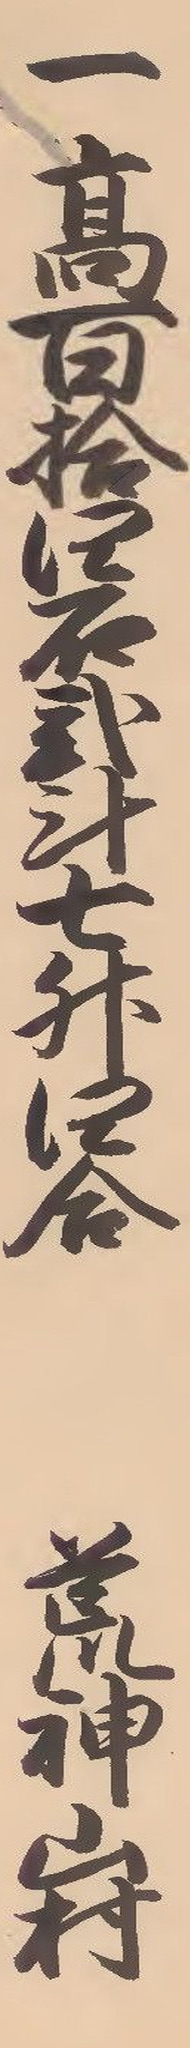一高百拾四石弐斗七升四合荒神山村

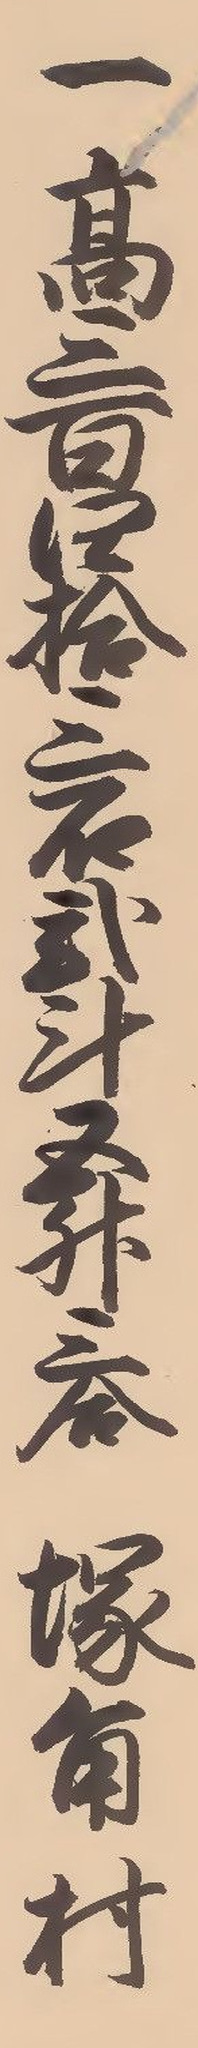一高三百四拾三石弐斗五升三合塚角村
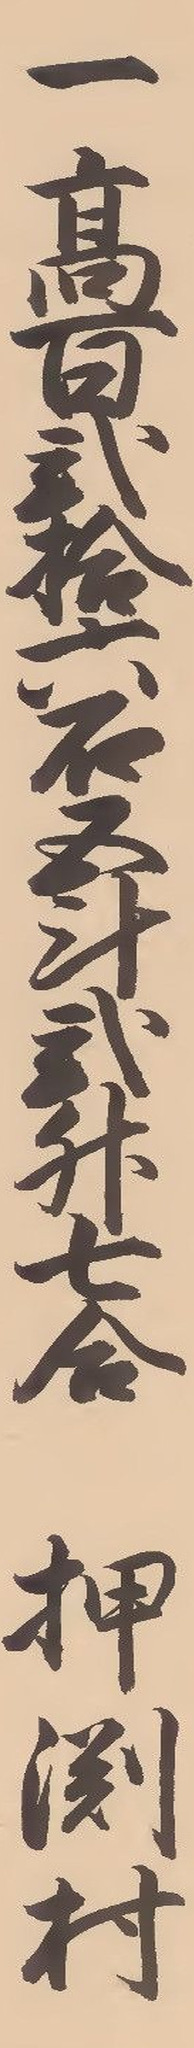一高百弐拾六石五斗弐升七合押淵村
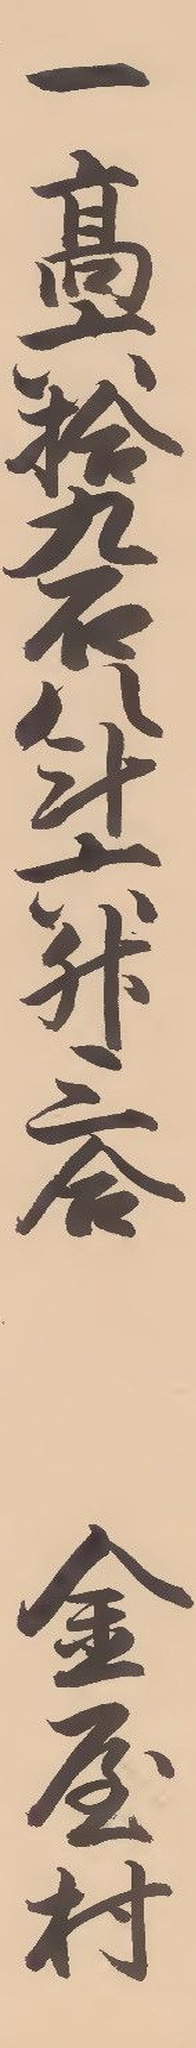一高六拾九石八斗六升三合金屋村
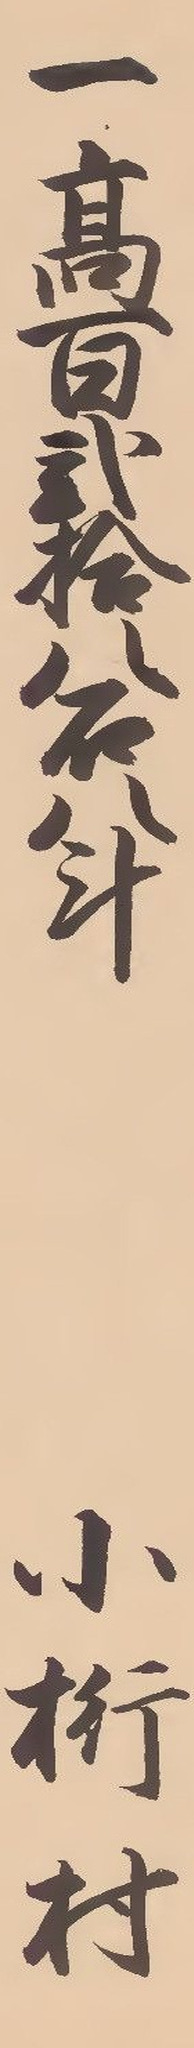一高百弐拾八石八斗小桁村
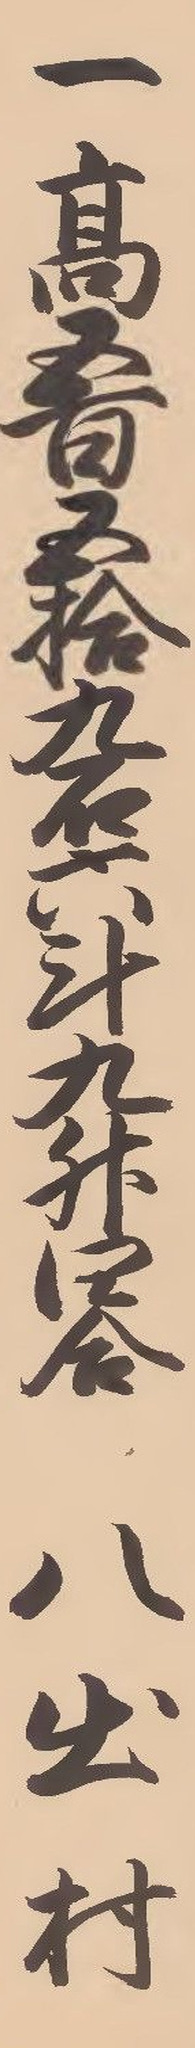一高五百五拾九石六斗九升四合八出村
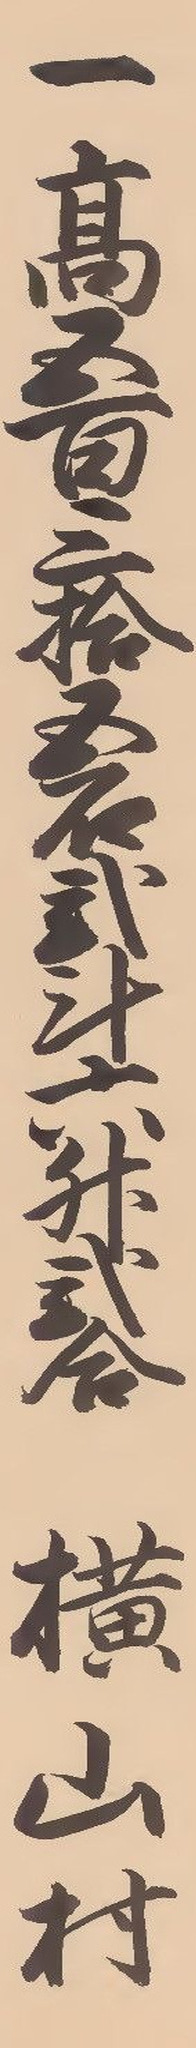一高五百三拾五石弐斗六升弐合横山村
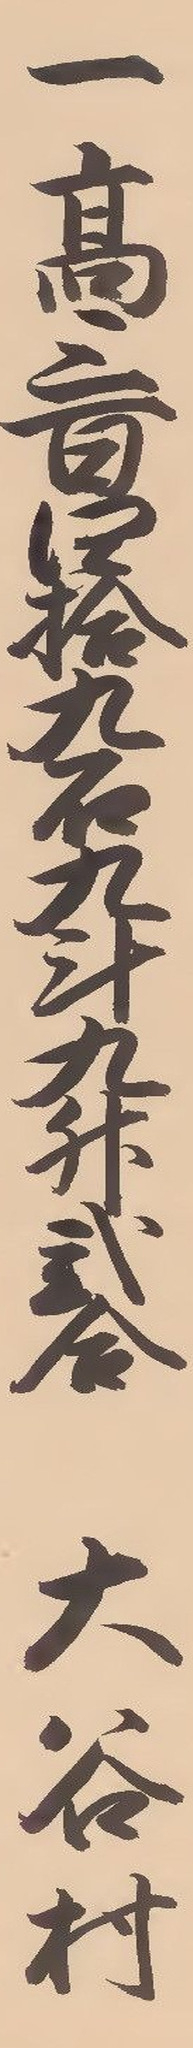一高三百四拾九石九斗九升弐合大谷村

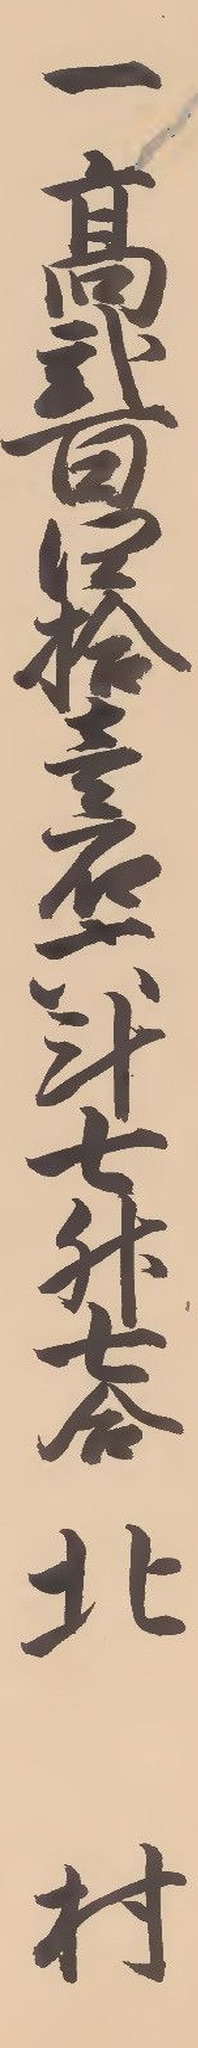一高弐百四拾壱石六斗七升七合北村
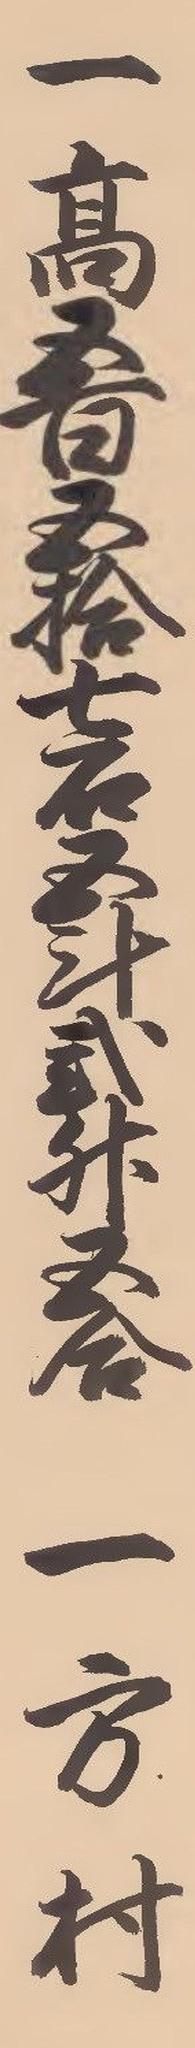一高五百五拾七石五斗弐升五合一方村
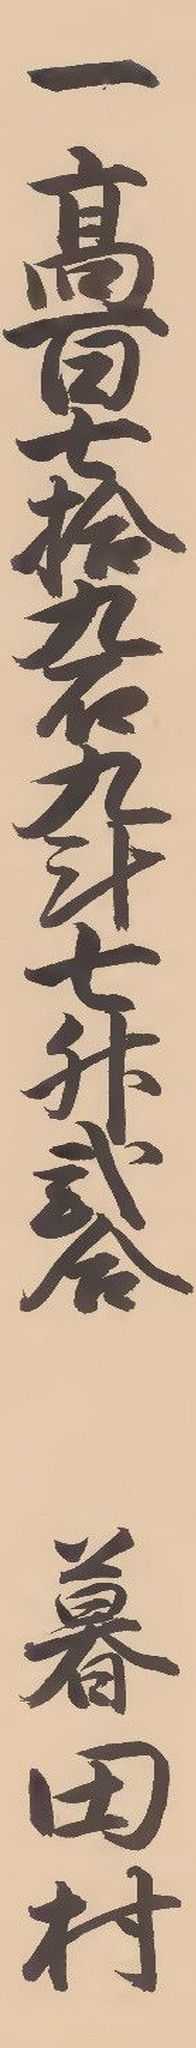一高百七拾九石九斗七升弐合暮田村
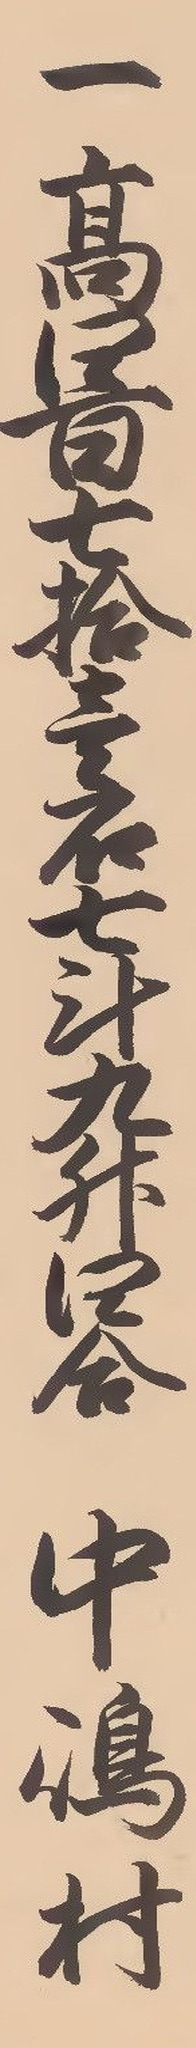一高四百七拾壱石七斗九升四合中島村
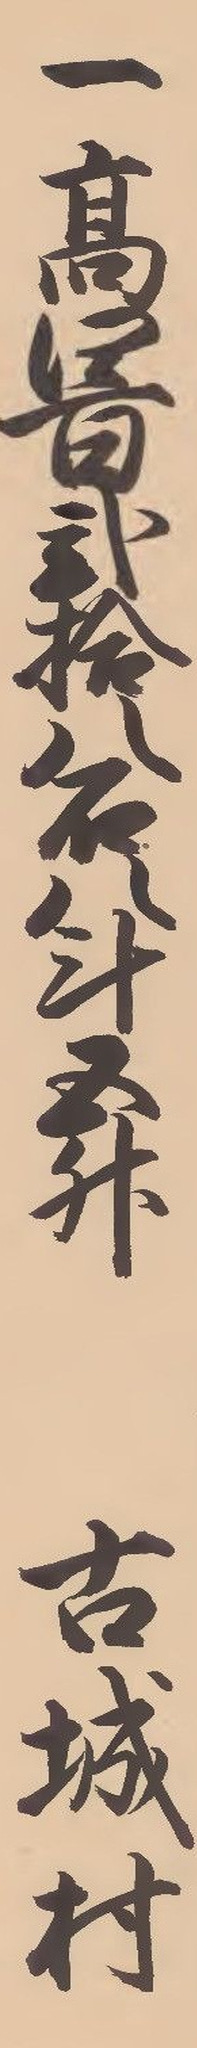一高四百弐拾八石八斗五升古城村
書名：美作国郷帳
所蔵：国立公文書館 National Archives of Japan
